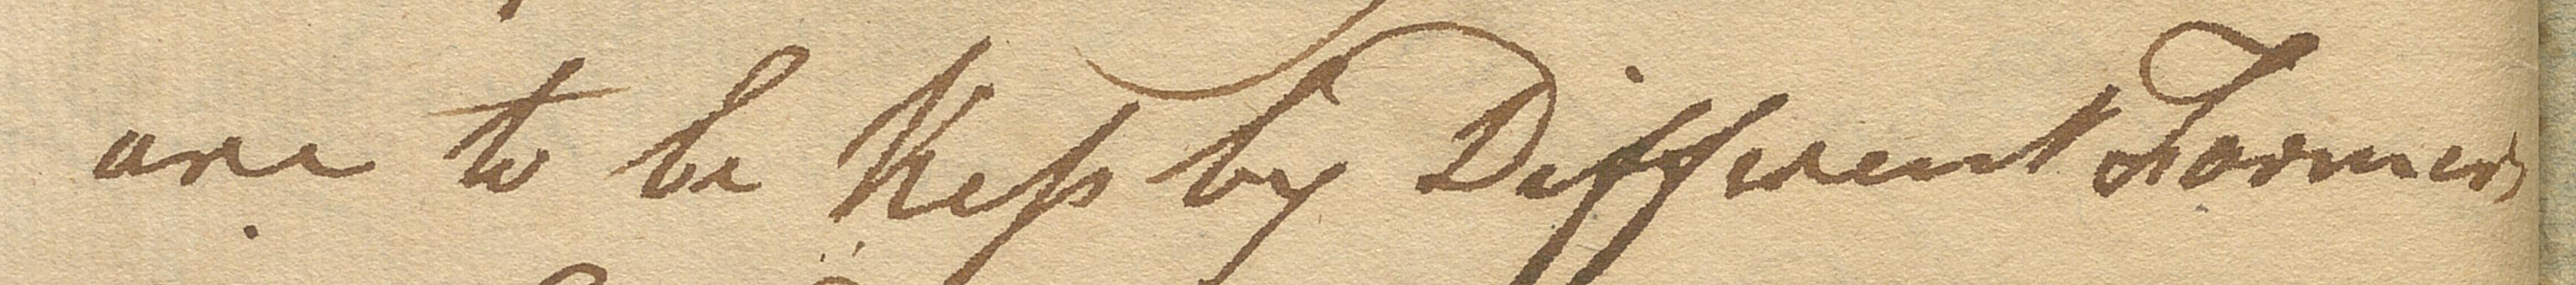are to be kep by Different Former
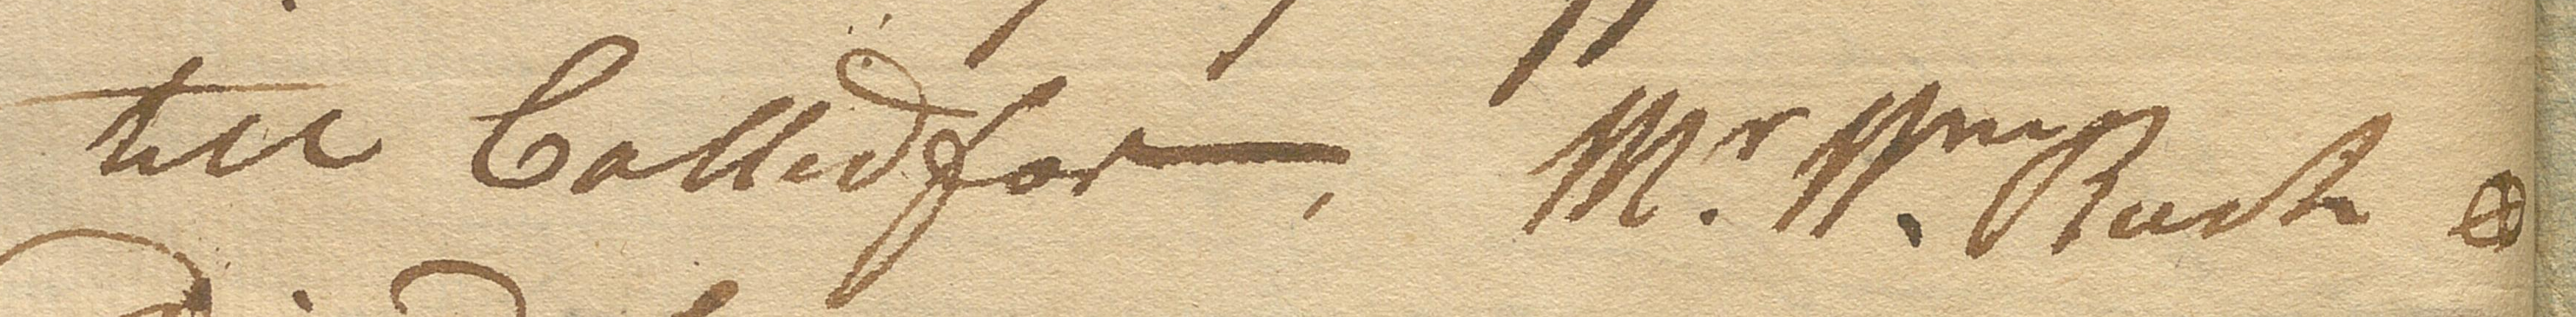till Calledfor, M^r. W^m. Rush
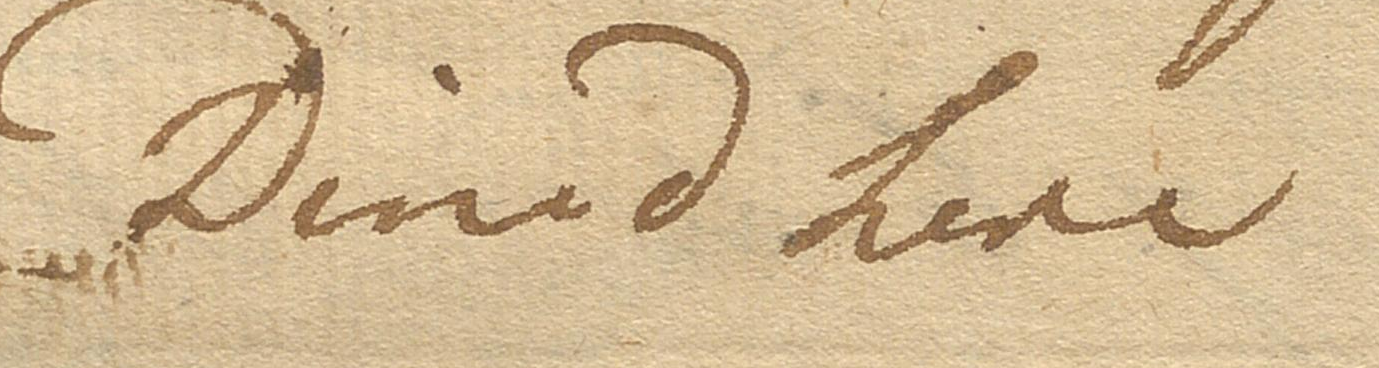Dined here
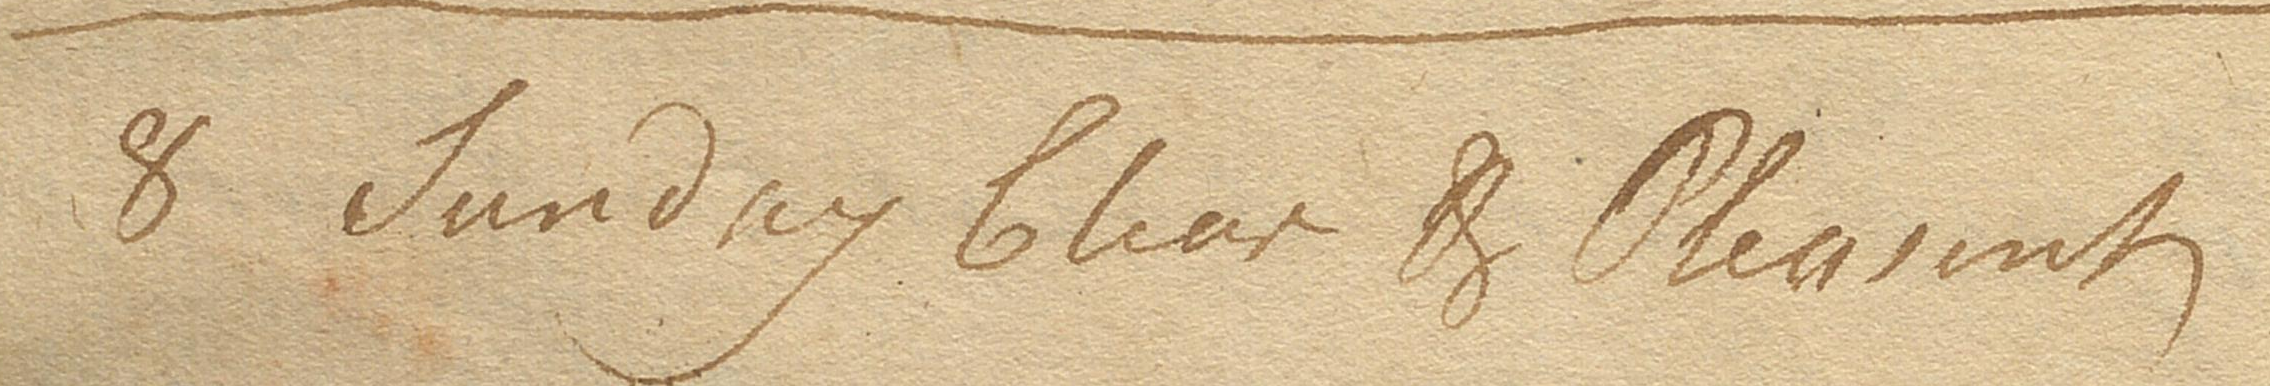8 Sunday Clear & Pleasent
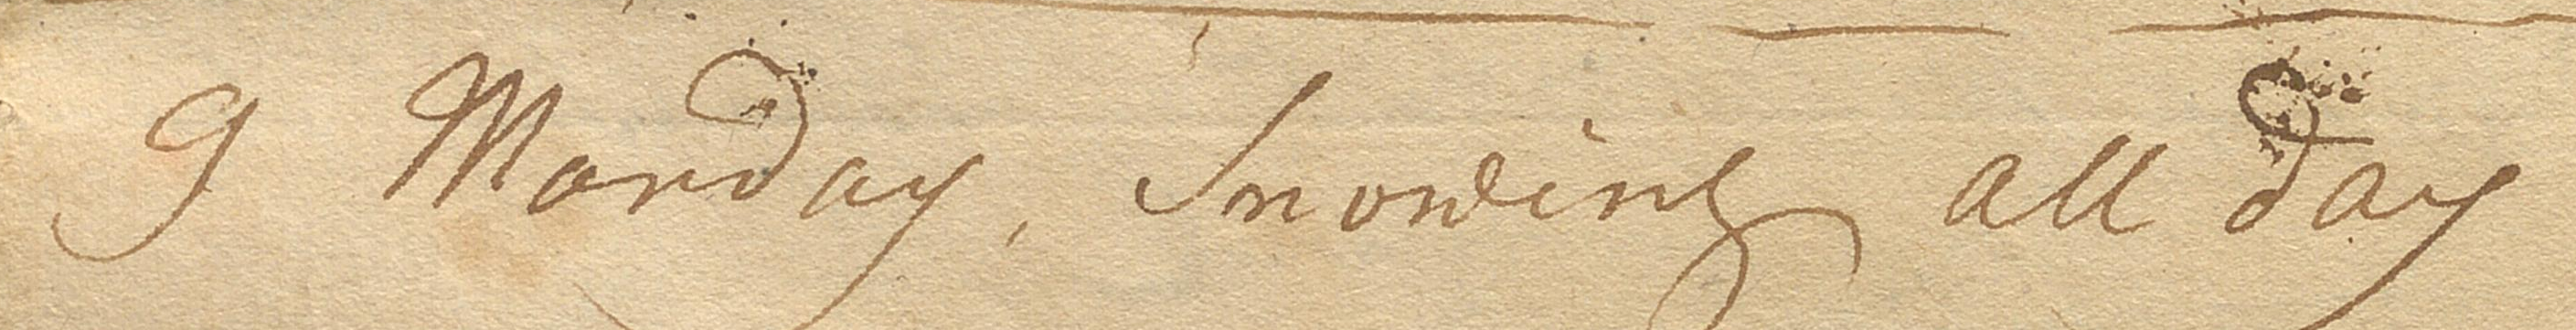9 Monday, snowing all day
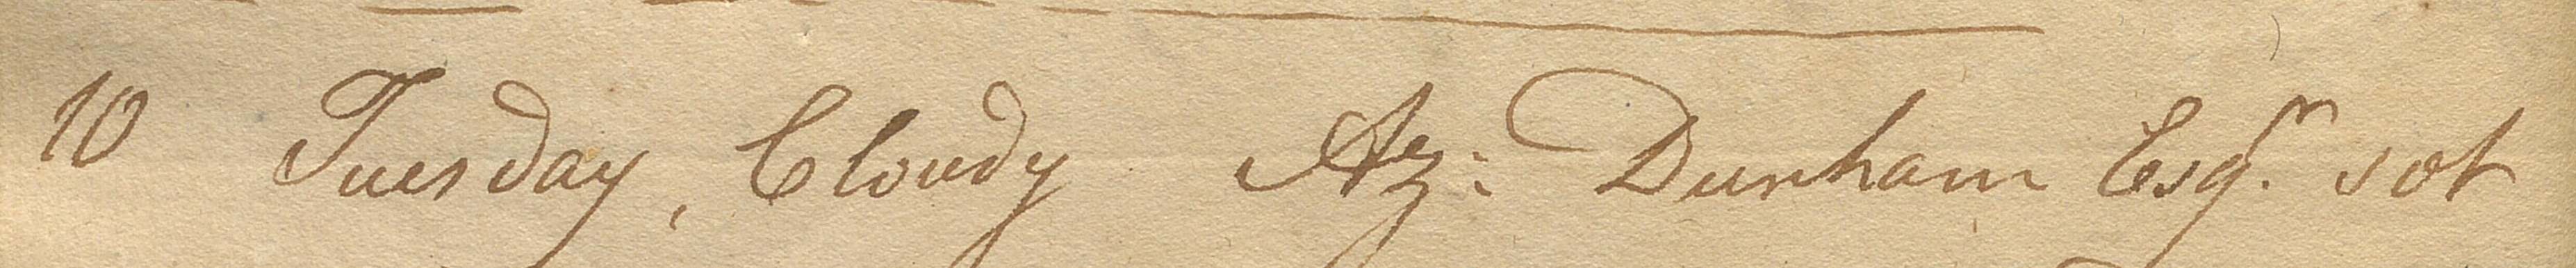10 Tuesday Cloudy Az: Durham Esq^r. set
